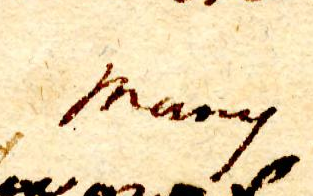many
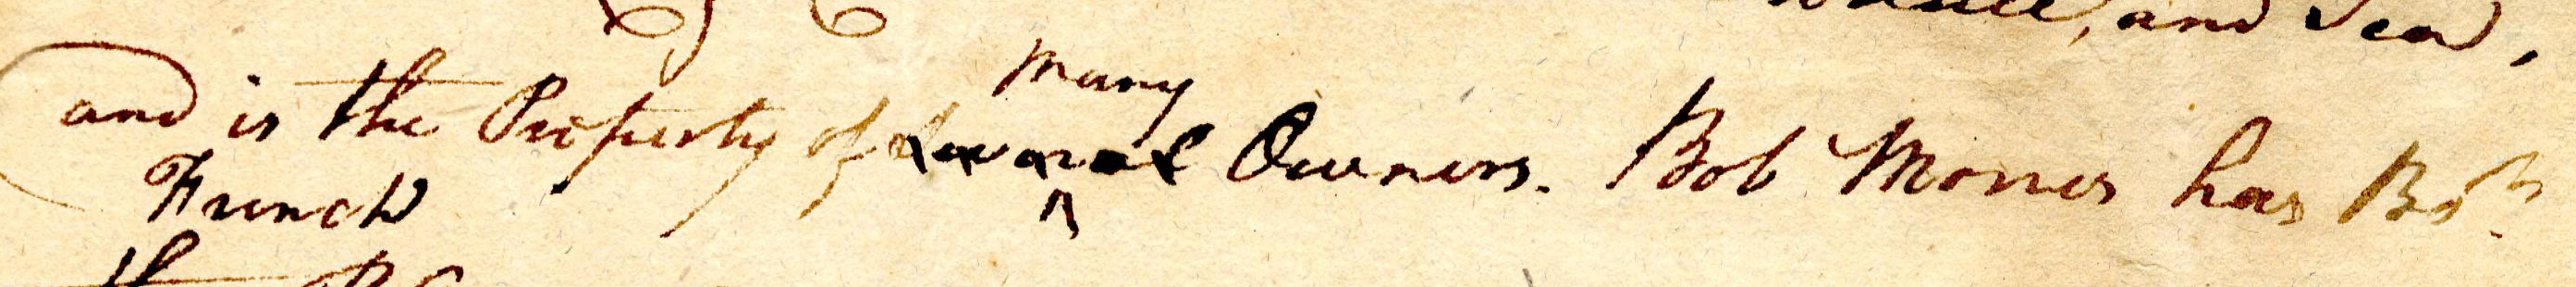and in the property of [several] ^ owners. Bob. Mones has Br^r.
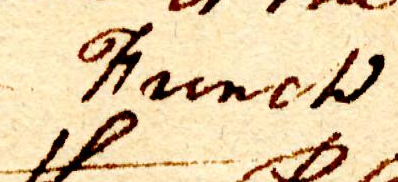French
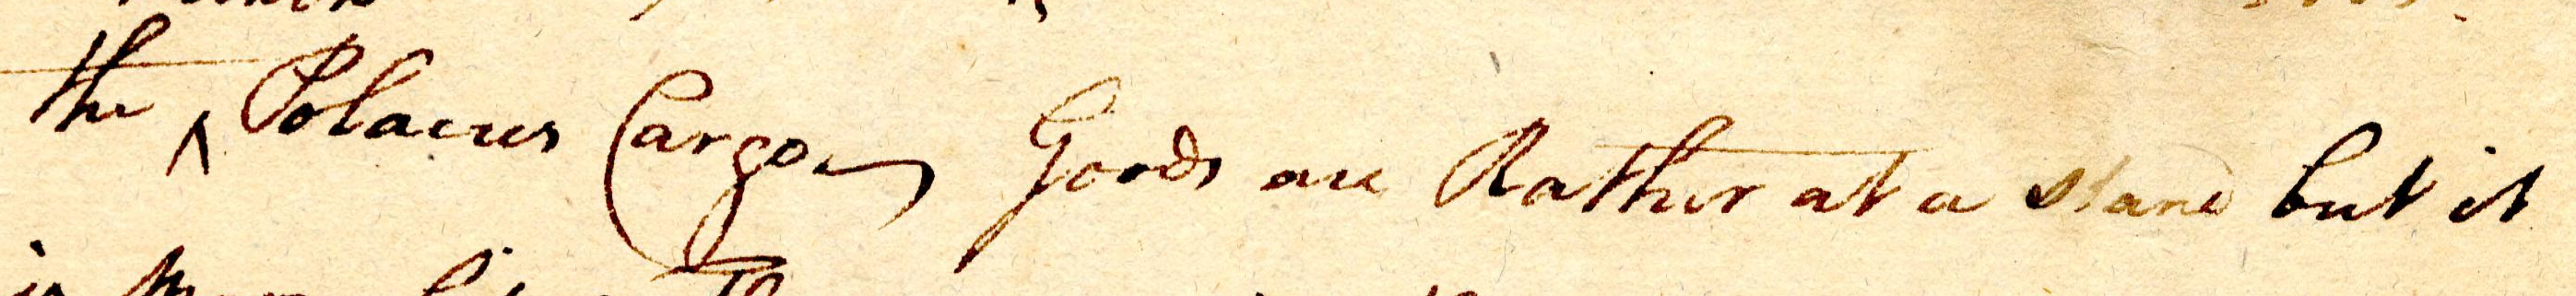the Palaces Cargo.- Goods are Rather at a stand but it
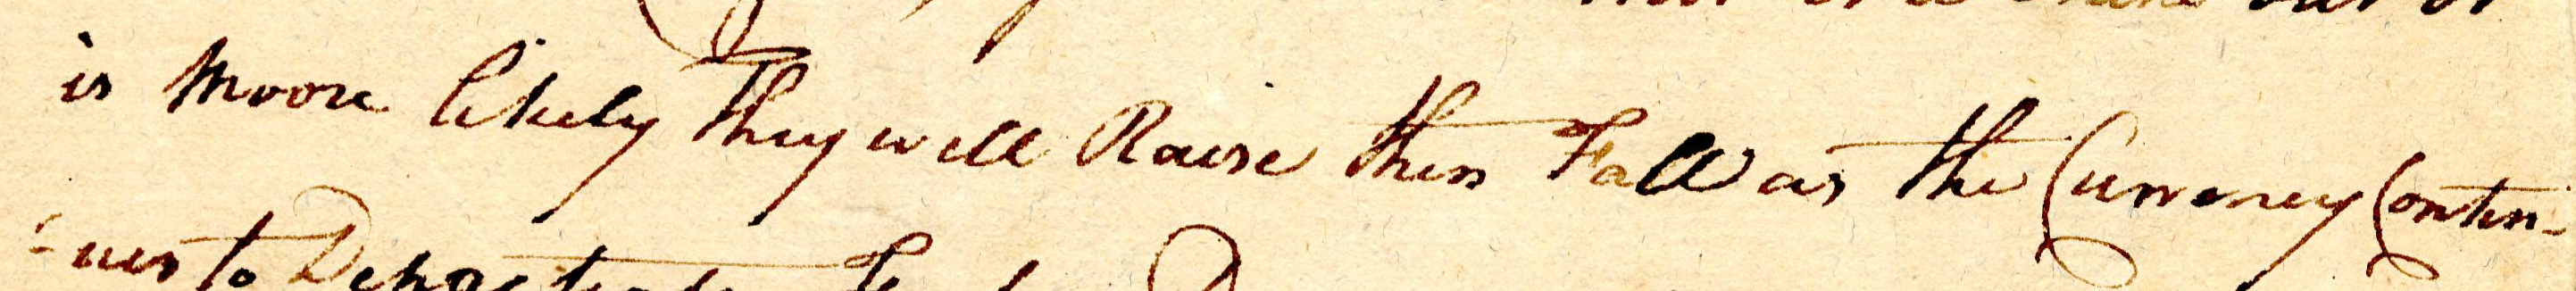is moore likely they will Raise then Fall as the Currency contin-
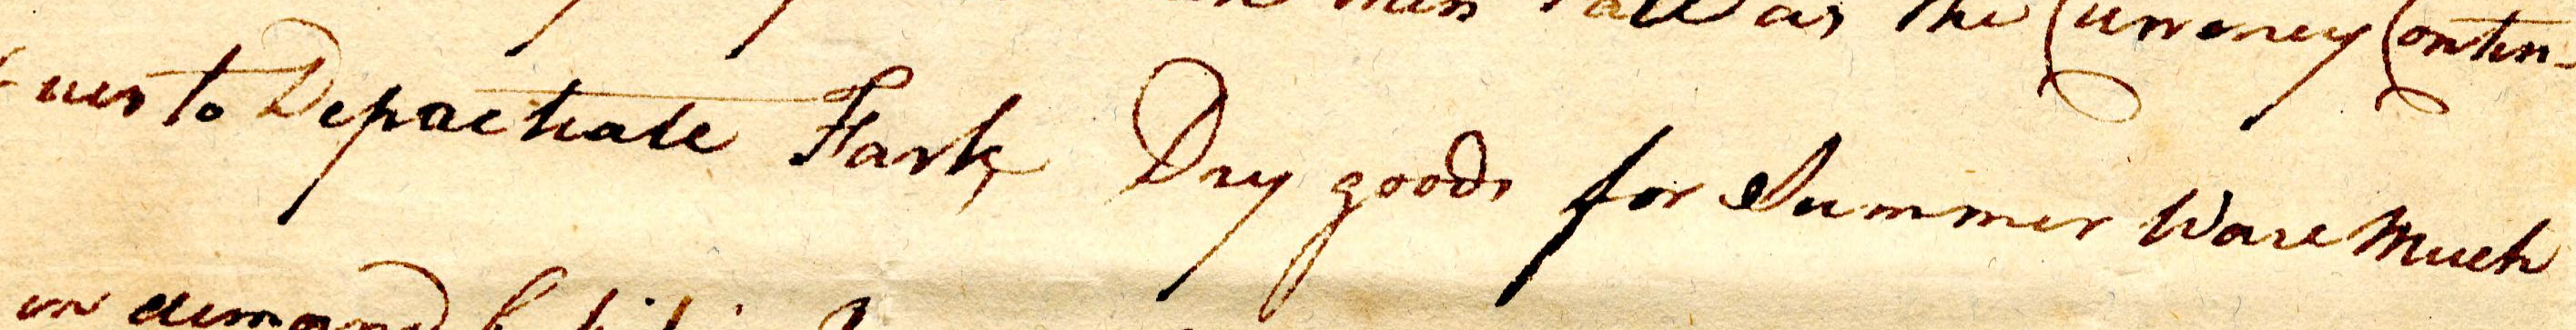-ues to Depractiate hark Dry goods for Summer Ware Much
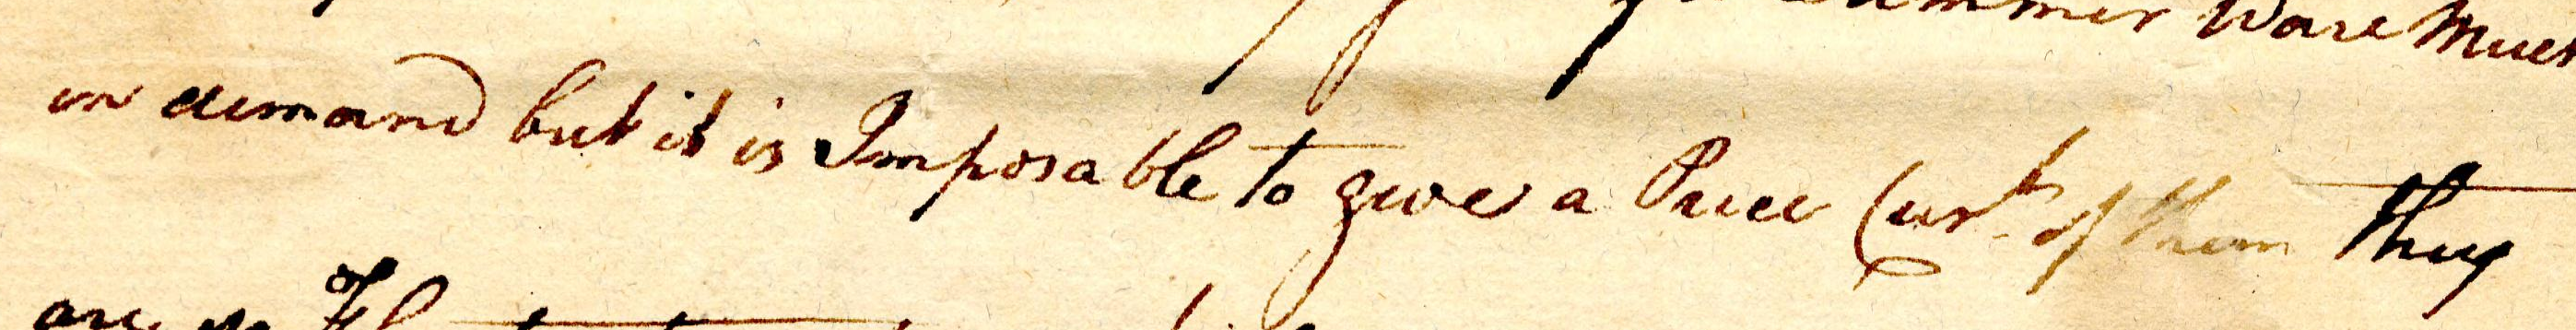in demand but it is Imposable to give a Price Cur^t. of them they
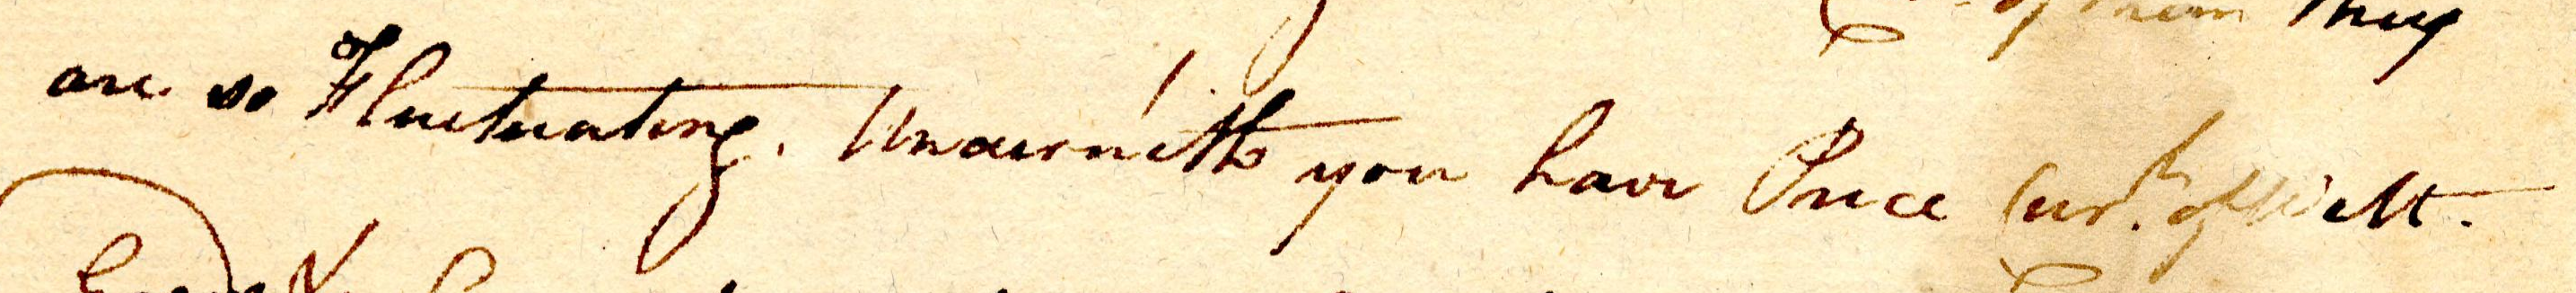are so Fluctuating. Undernith with you have Price Cur^t. of Wett
